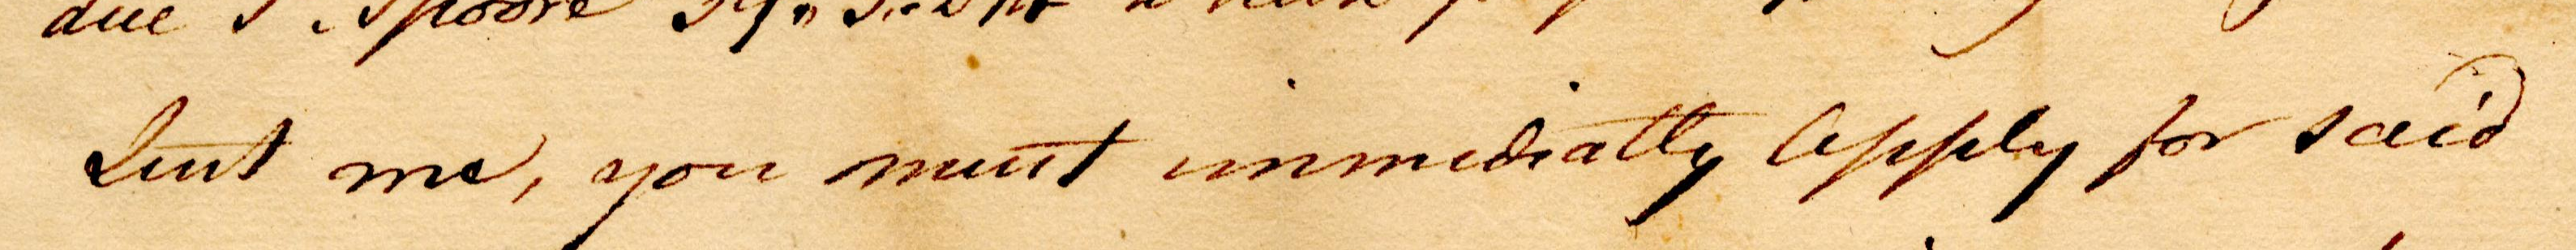Lent me, you must immediately apply for said
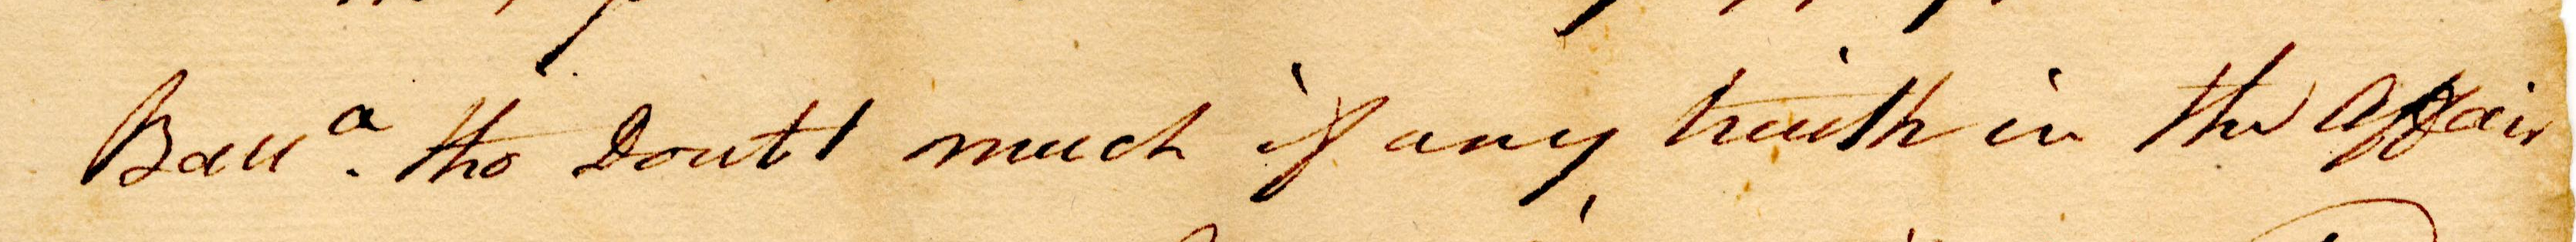Ball^ce. tho Doubt much if any faith in the Affair
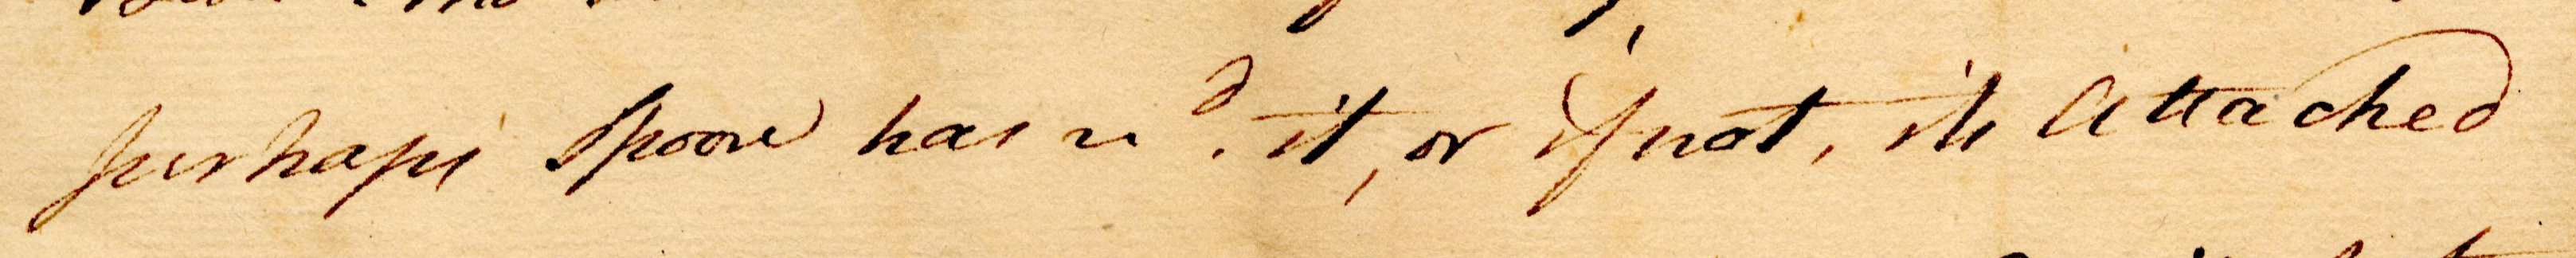perhaps Spoore has re^d. it, or if not, its Attached
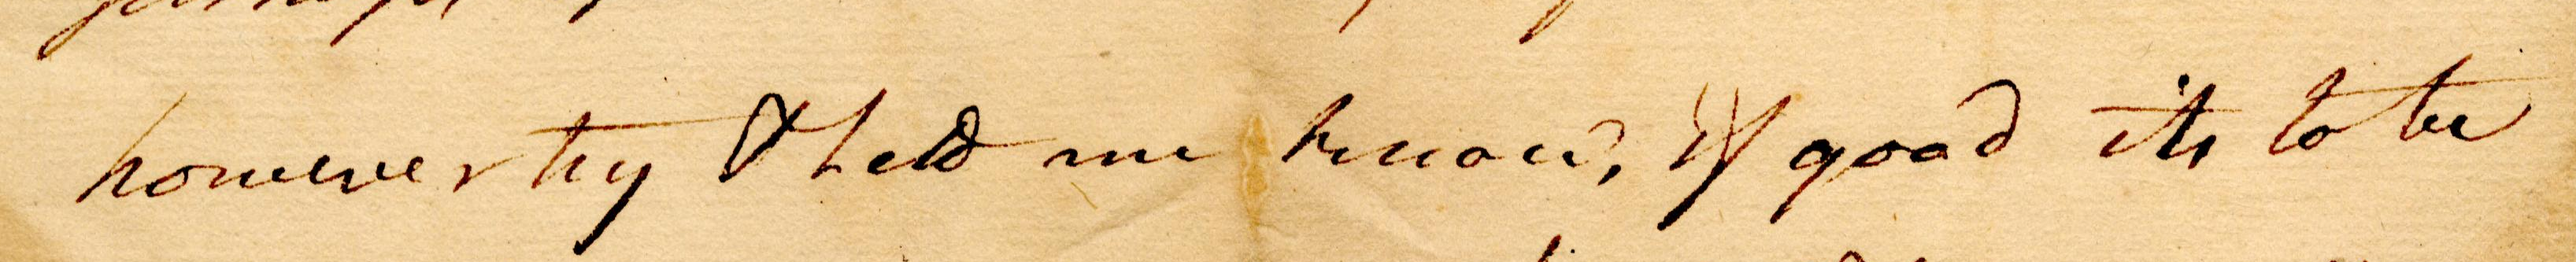however try & Letd me know, if good its to be
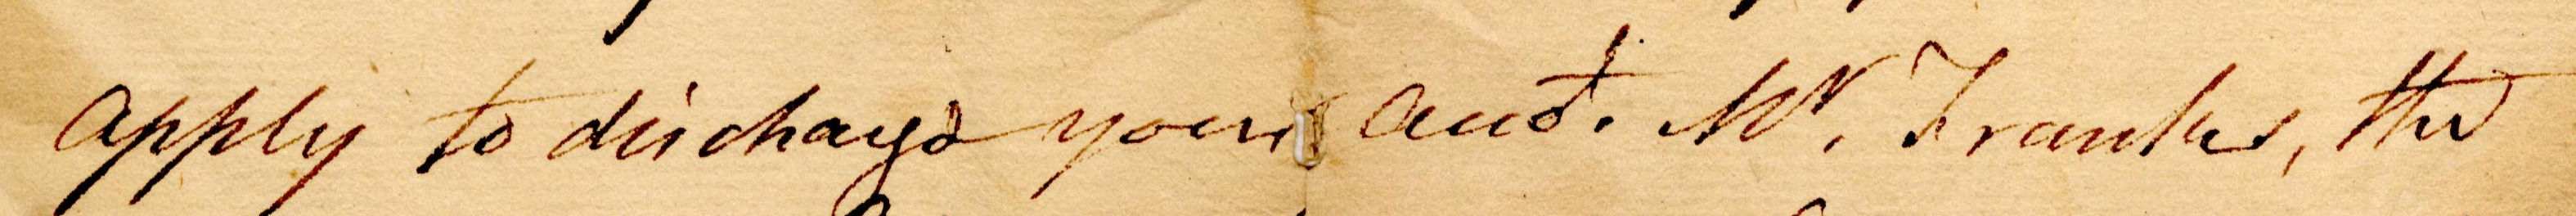apply to dischargd your acco^t. M^r. Frank, the
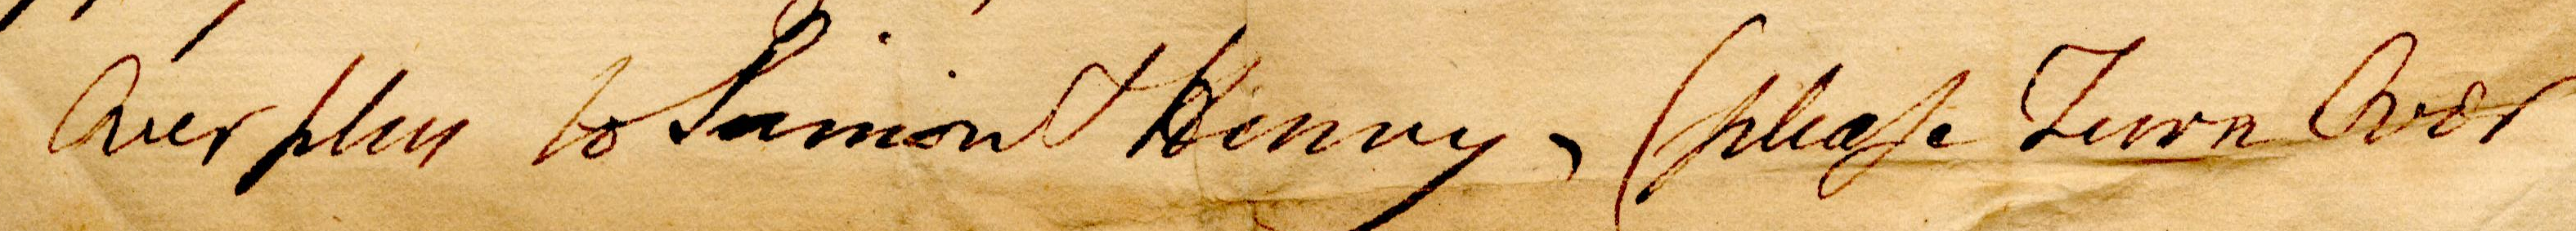over plus to Simon & Kenny- (please turn Over
